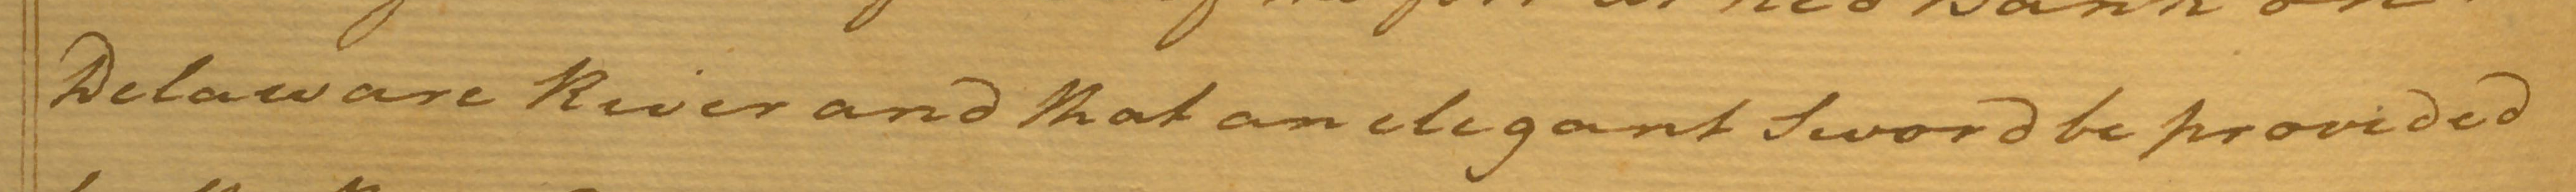Delaware River and that an elegant sword be provided
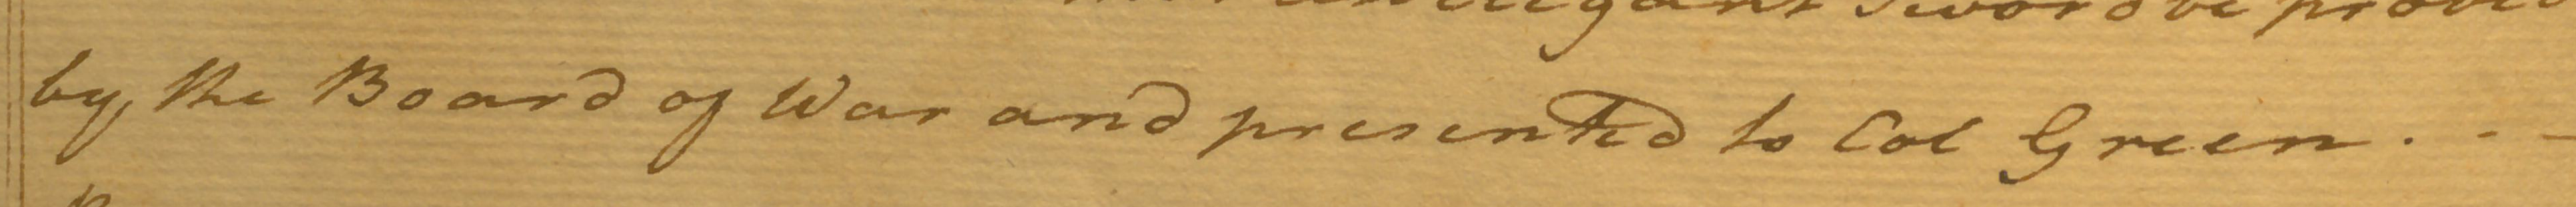by the Board of War and presented to Col Green.
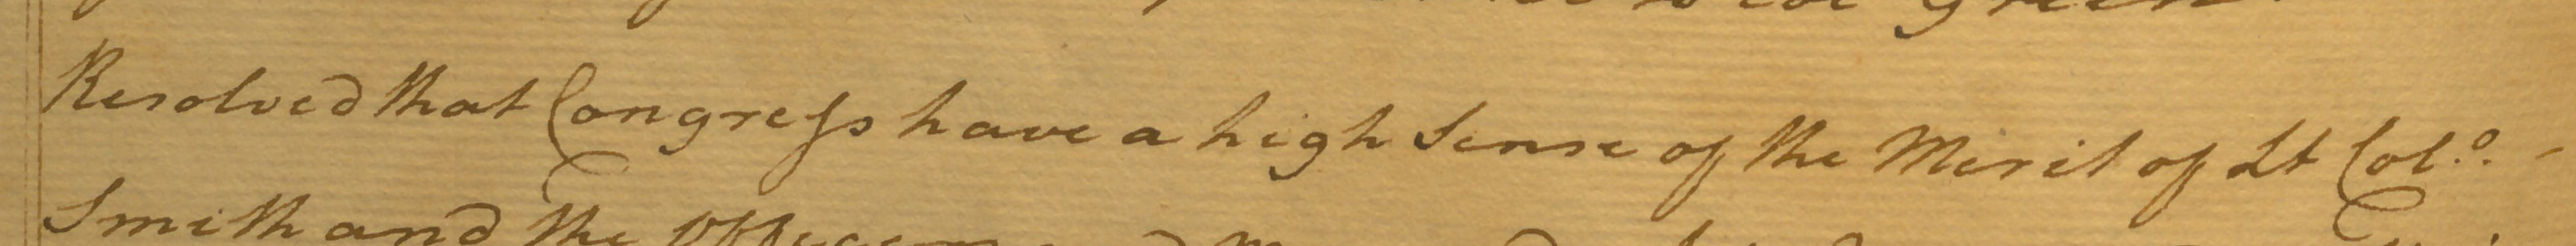Resolved that Congress have a high sense of the Merit of Lt Col^o.
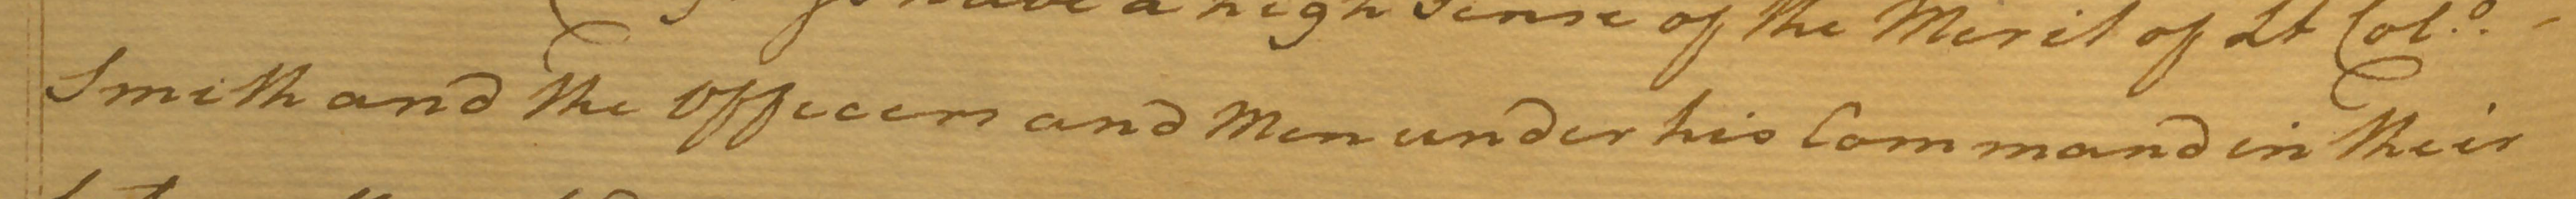Smith and the Officers and men under his Command in their
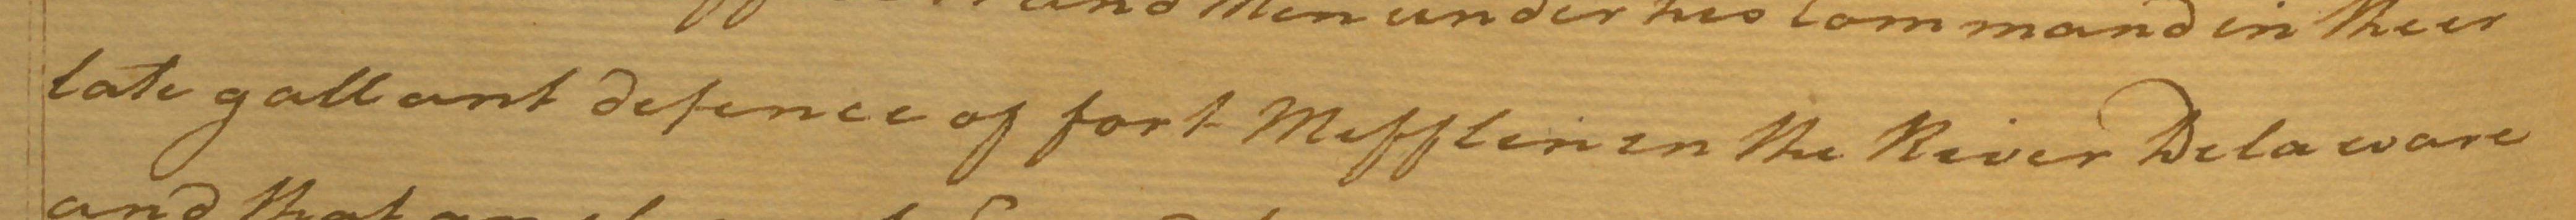late gallant defence of fort Mifflin in the River Delaware
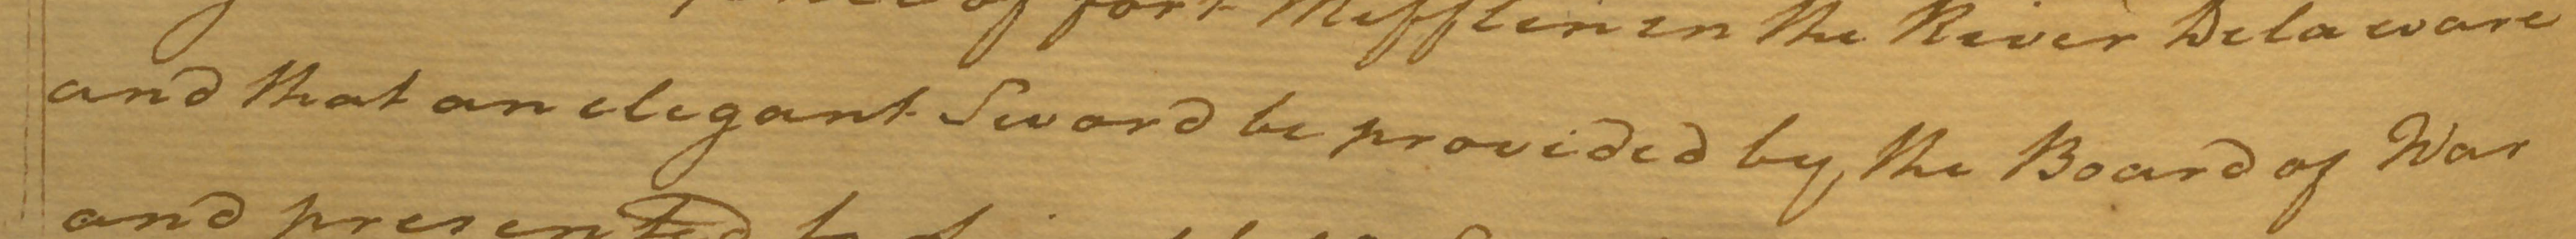and that an elegant Sword be provided by the Board of War
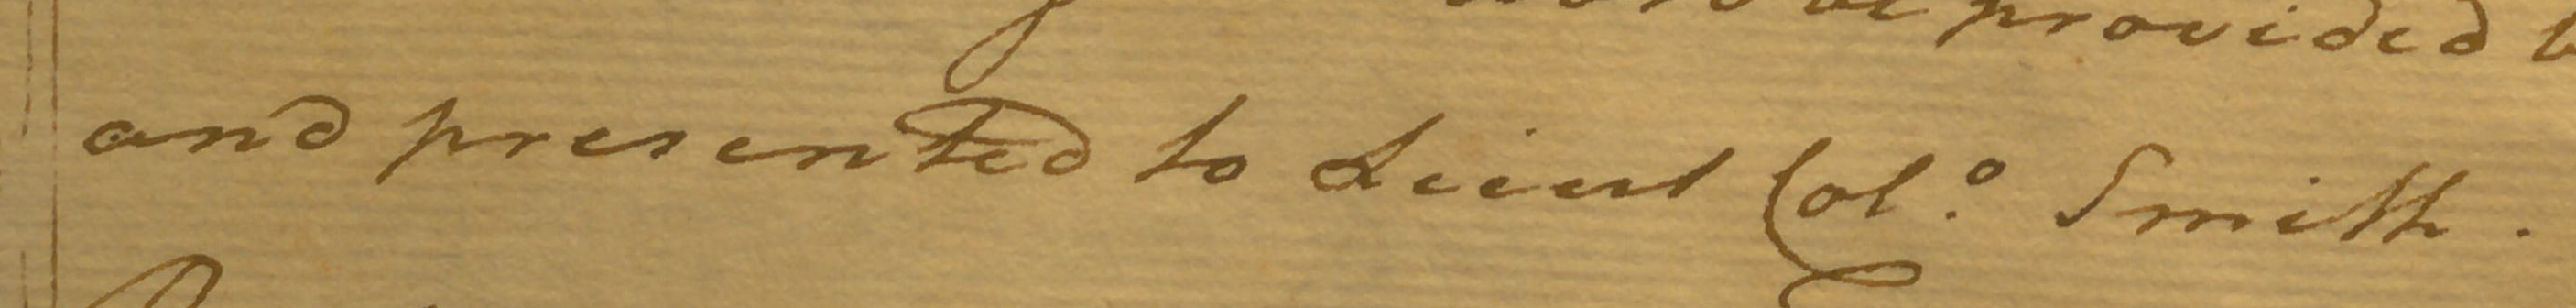and presented to Lieut Col^o. Smith.
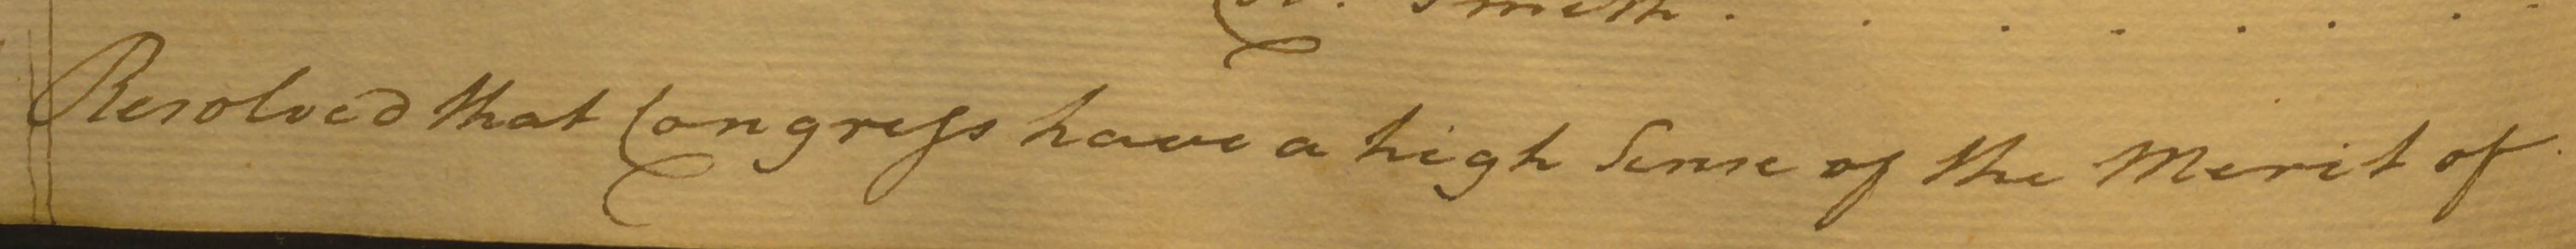Resolved that Congress have a high sense of the merit of
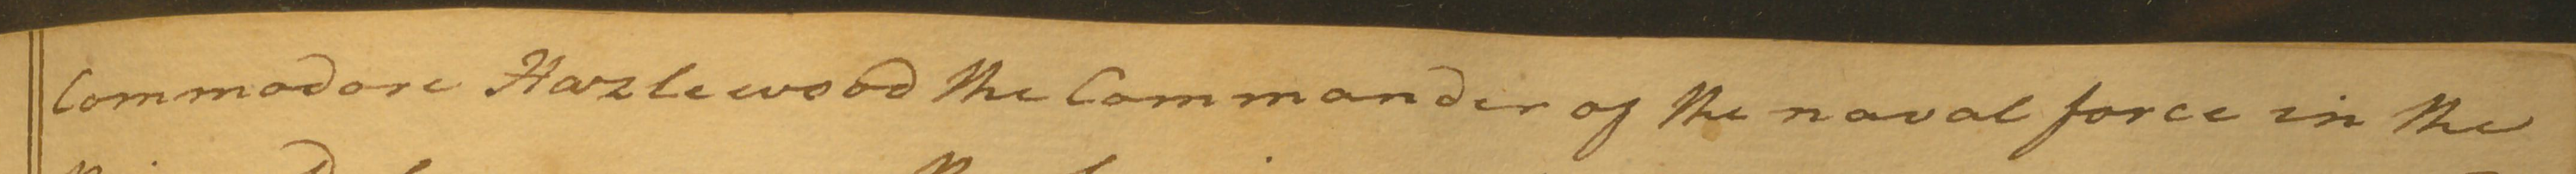Commodore Hazlewood the Commander of the naval force in the
